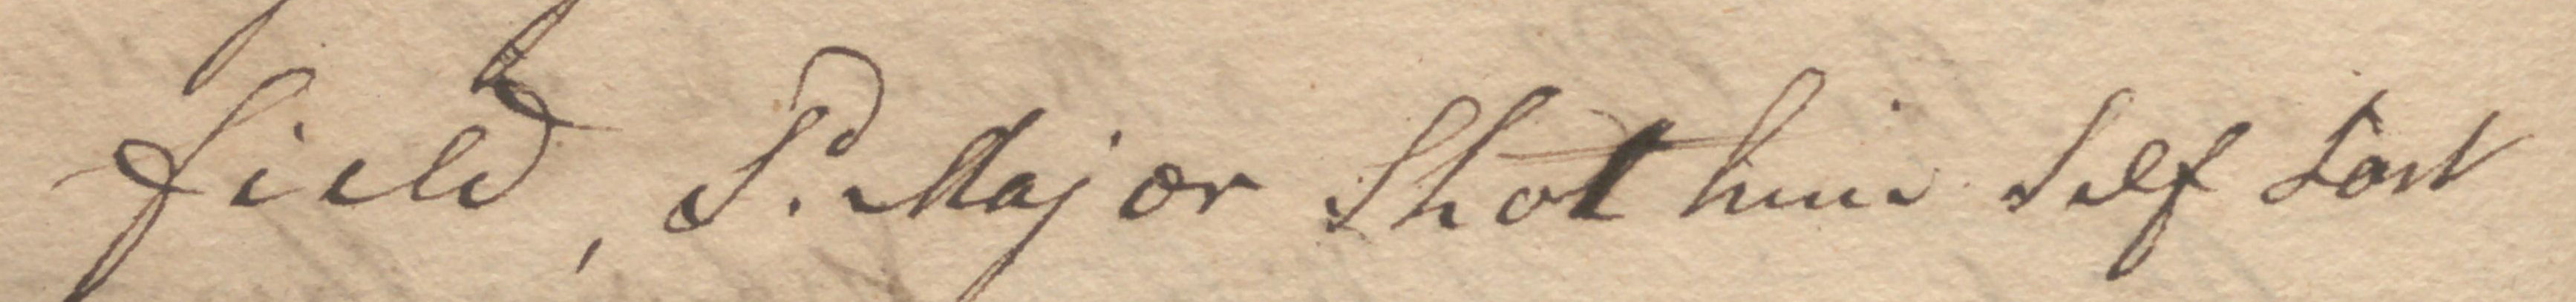field s^d. Maj or Shot hime self Last
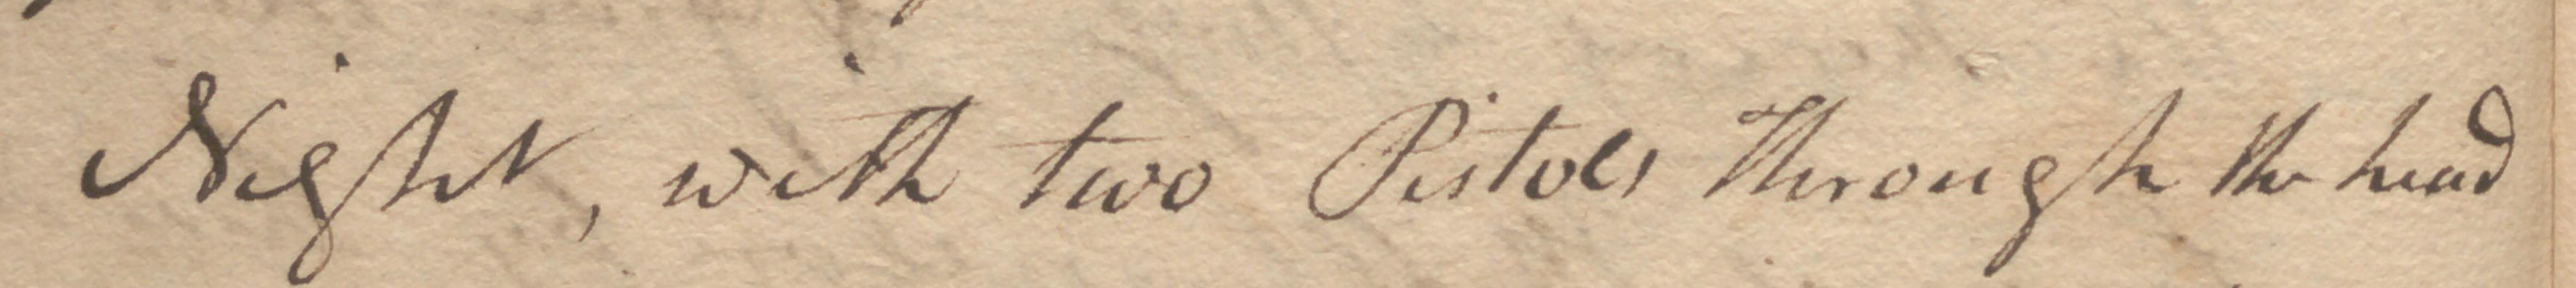Night, with two Pistols through the head
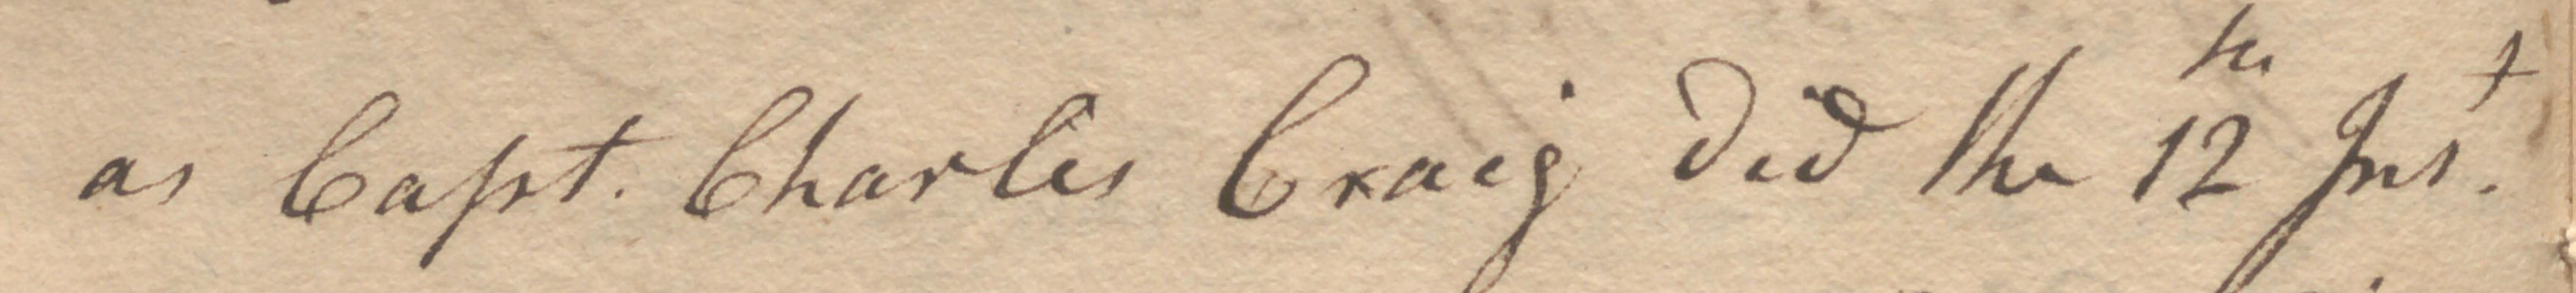as Capt. Charles Craig did the 12^th Ins^s.
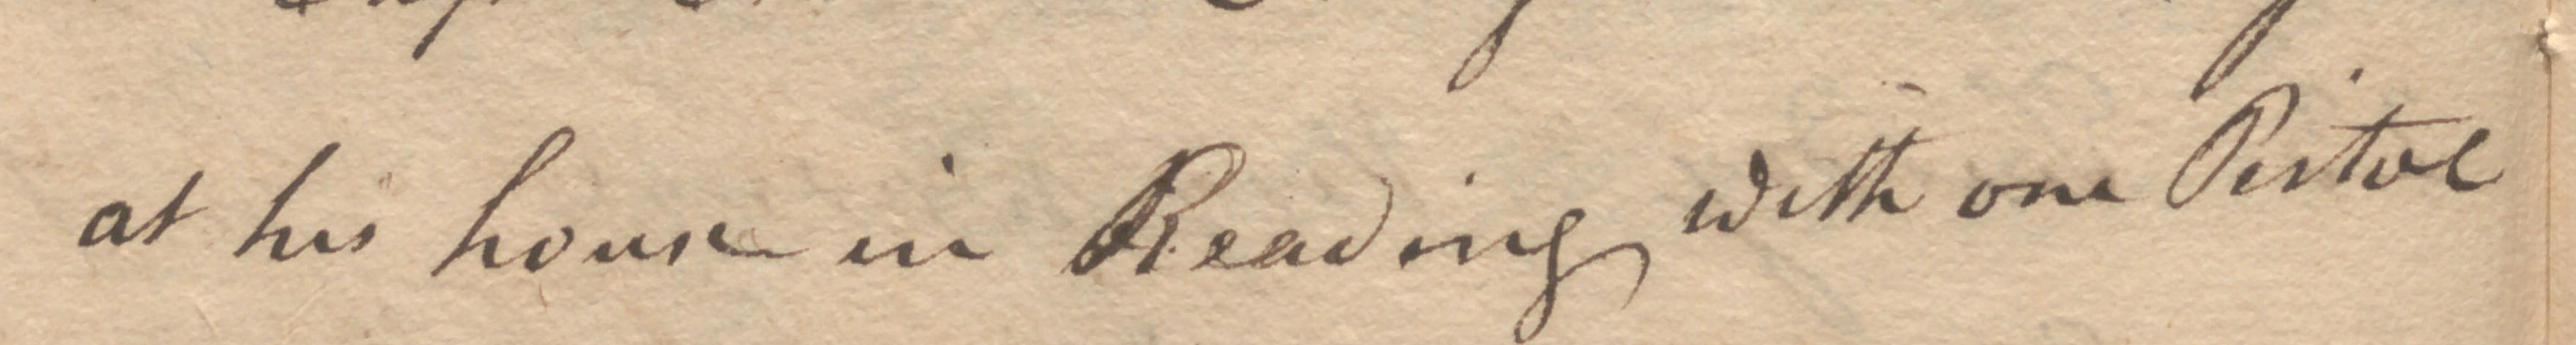at his house in Reading with one Pistol
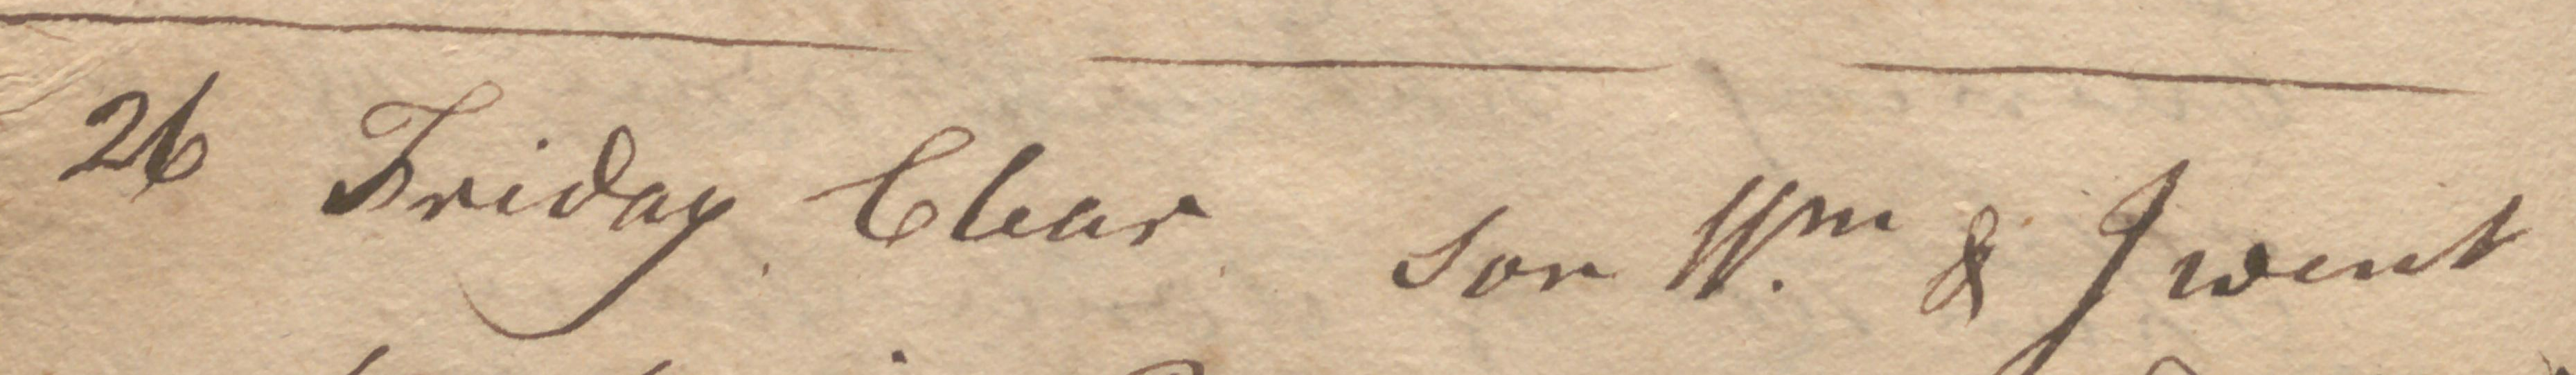26 Friday Clear son W^m. & I went
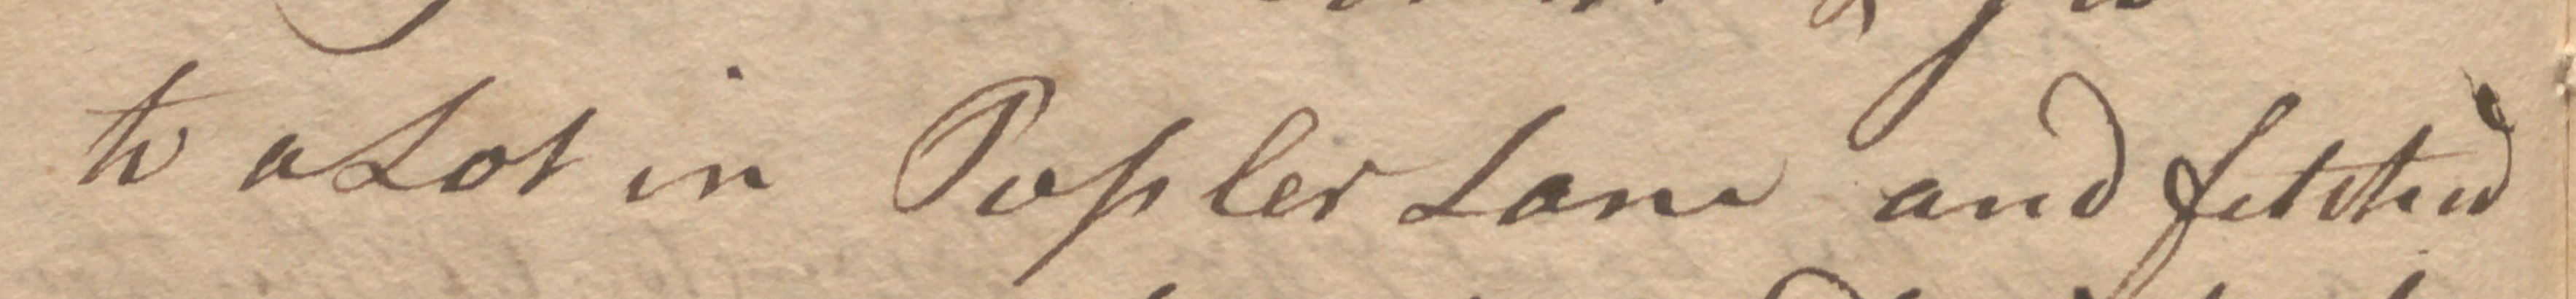to a Lot in Popler Lane and fetched
